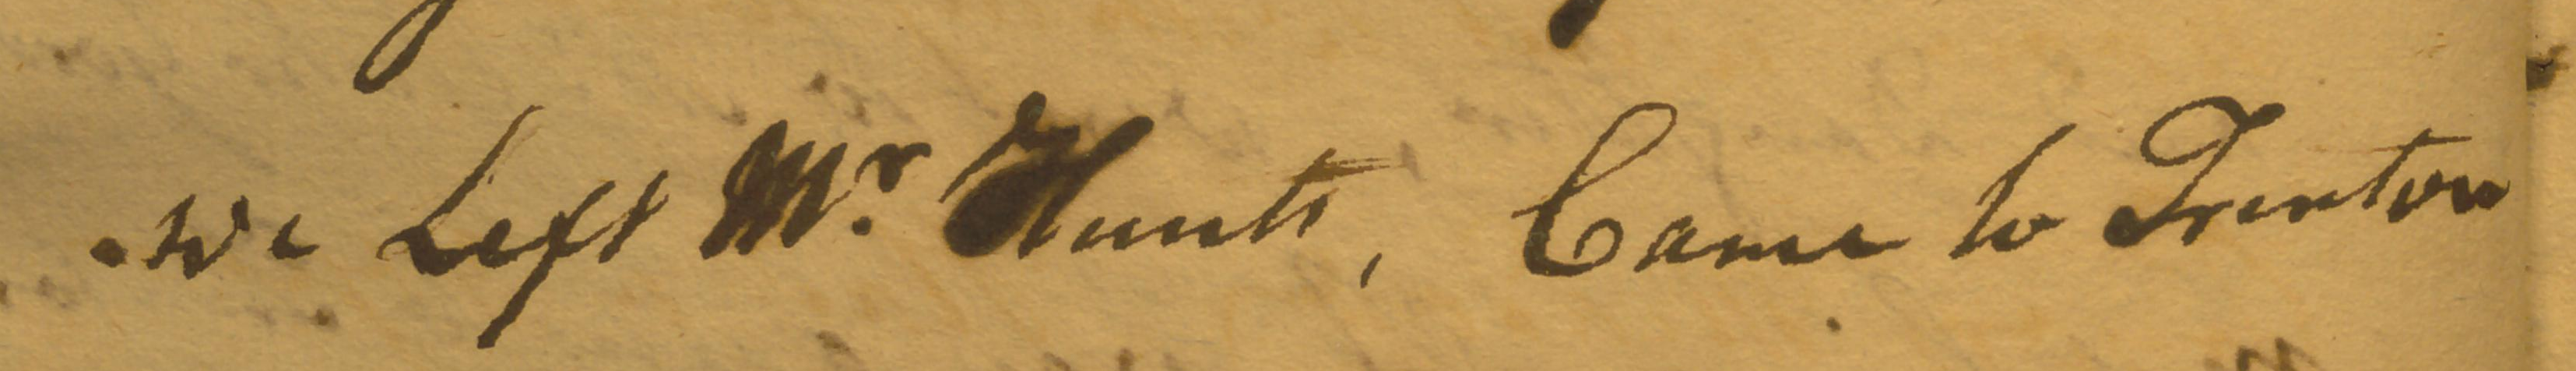we Left M^r. Hunts Came to Trenton
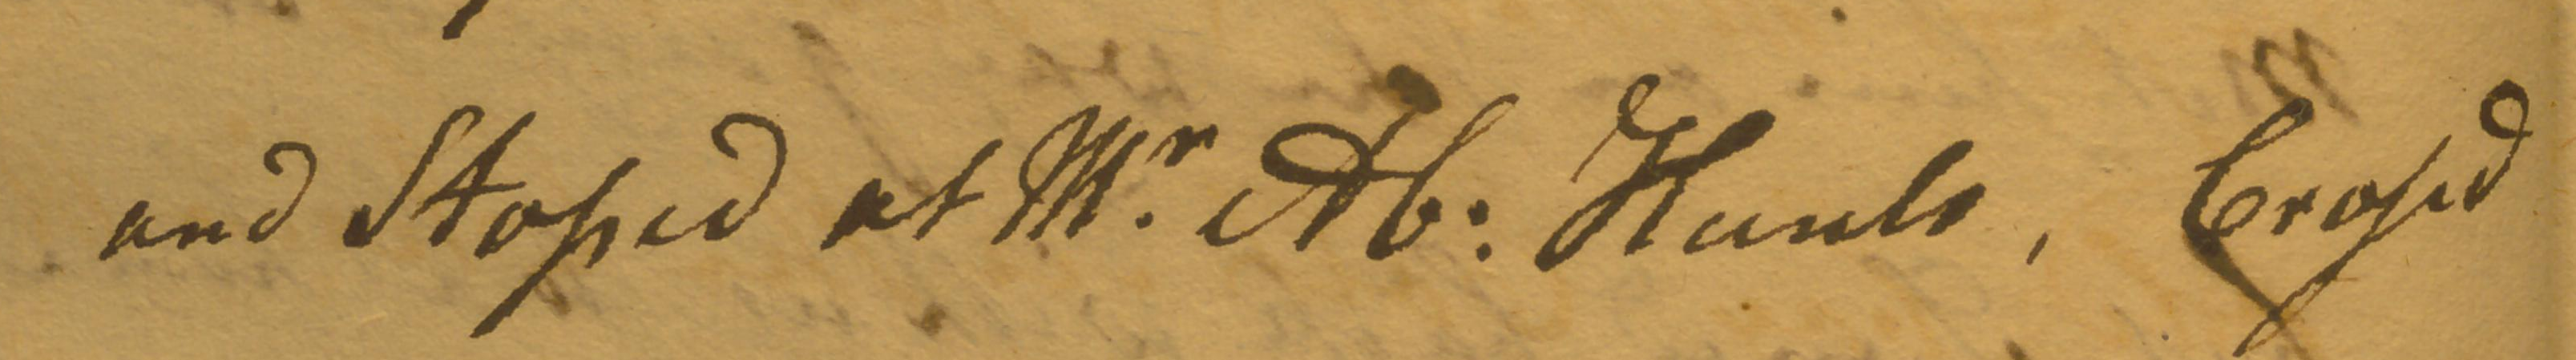and Stoped at M^r. Ab: Hunts. Crosed
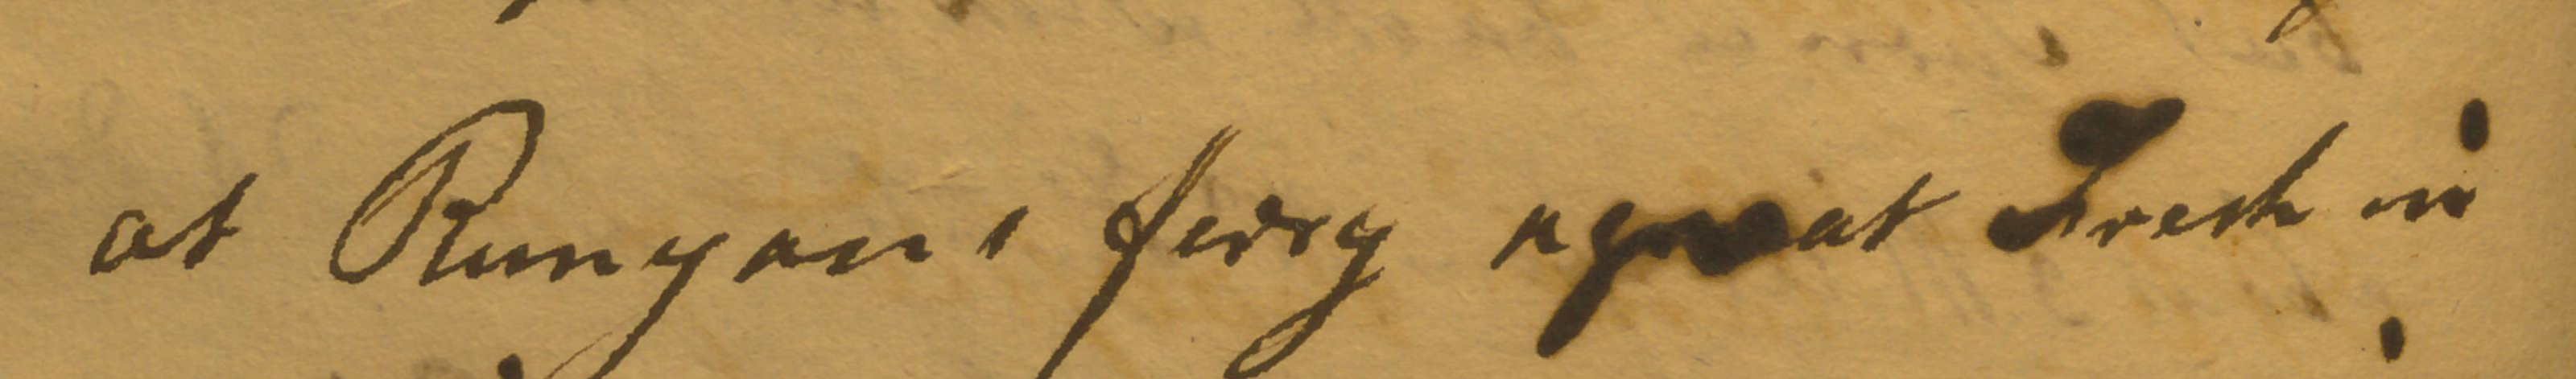at Runyans ferry a great Fresh in
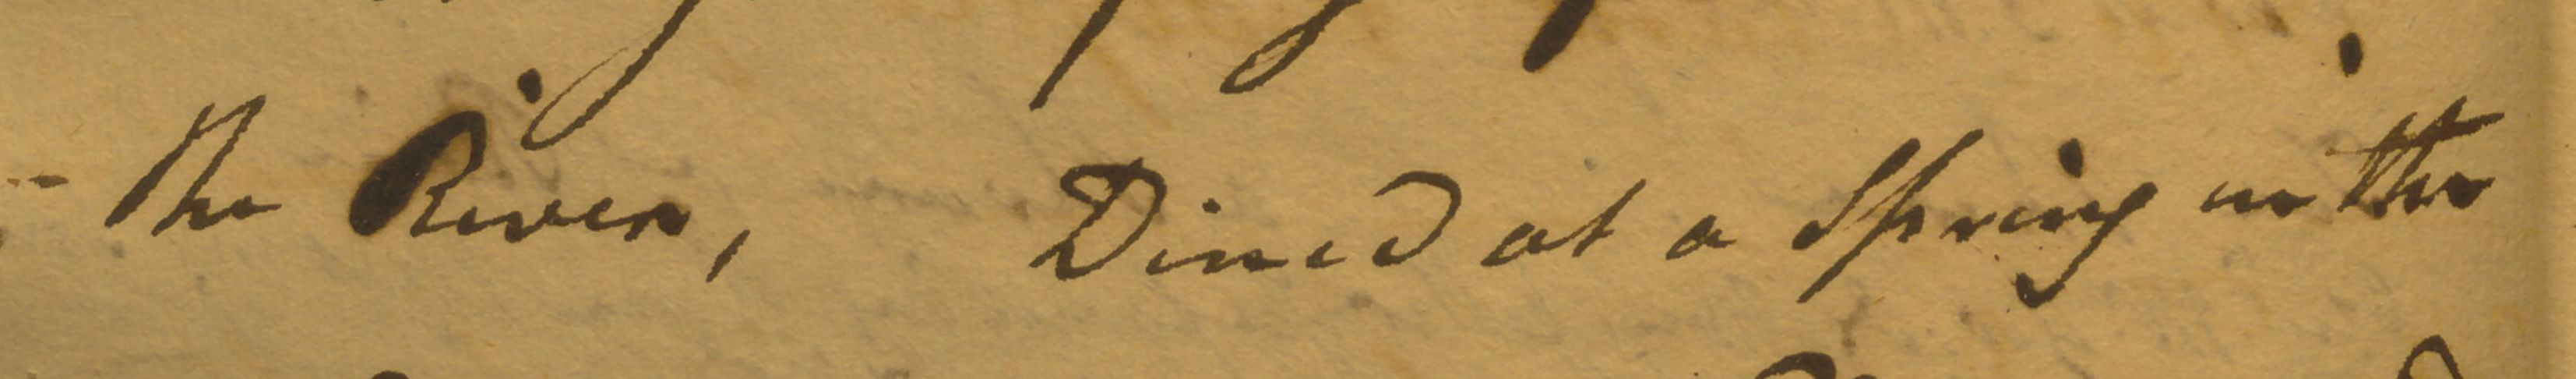the River, Dined at a spring in the
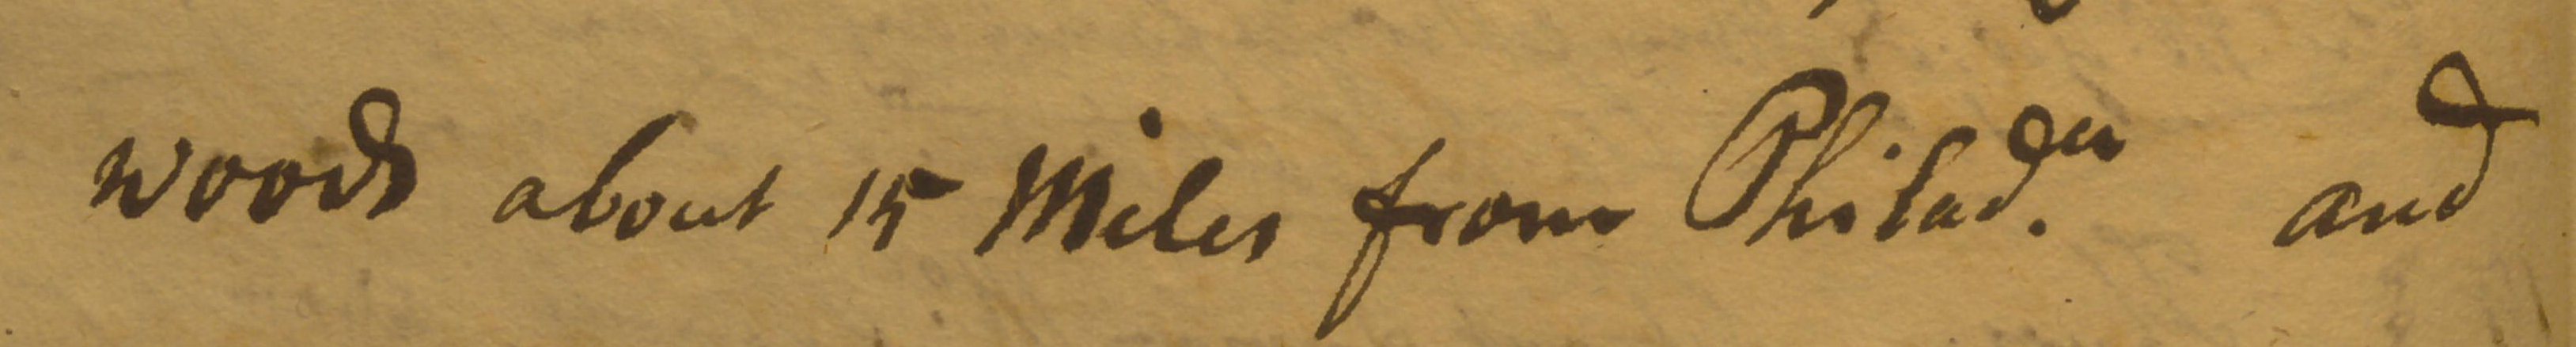woord about 15 Miles from Philad^a. and
